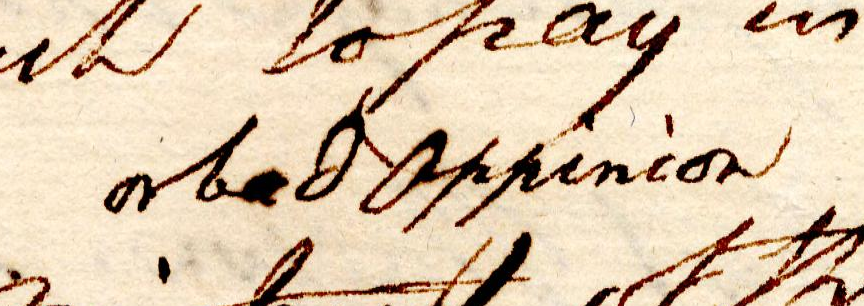or bad oppinion
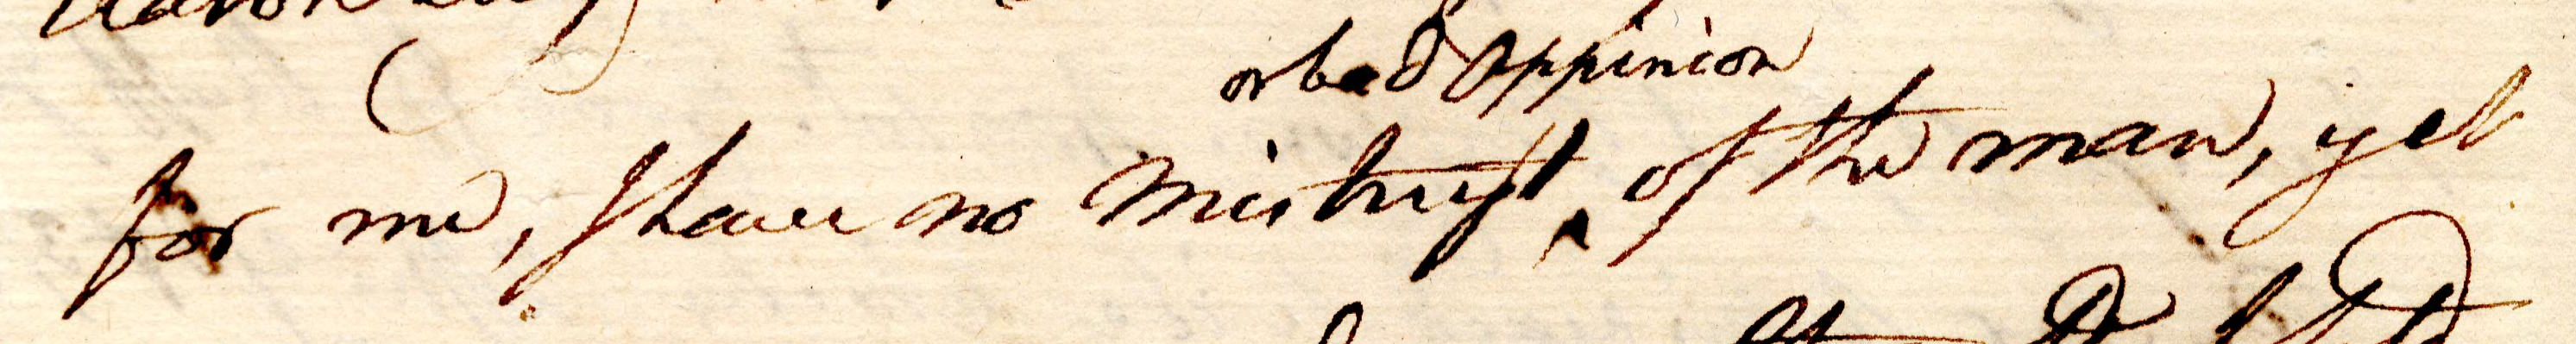for me, I have no mistrust ^ of the man, yet
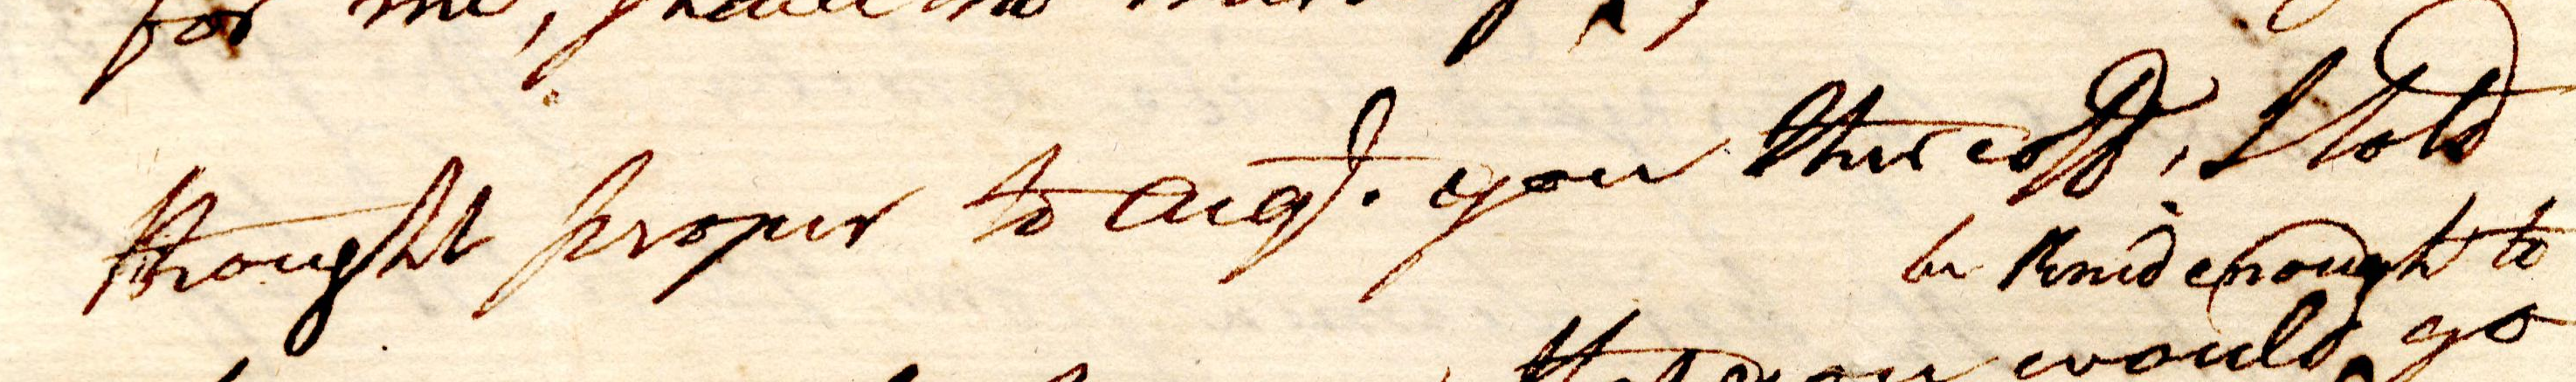thought proper to Acq^t. you thereoff, I told
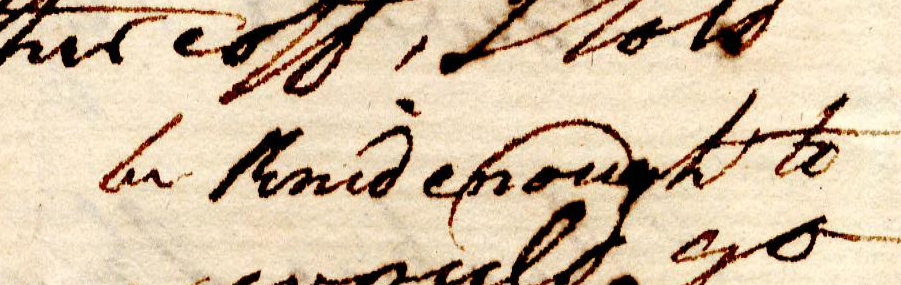be kind enough to
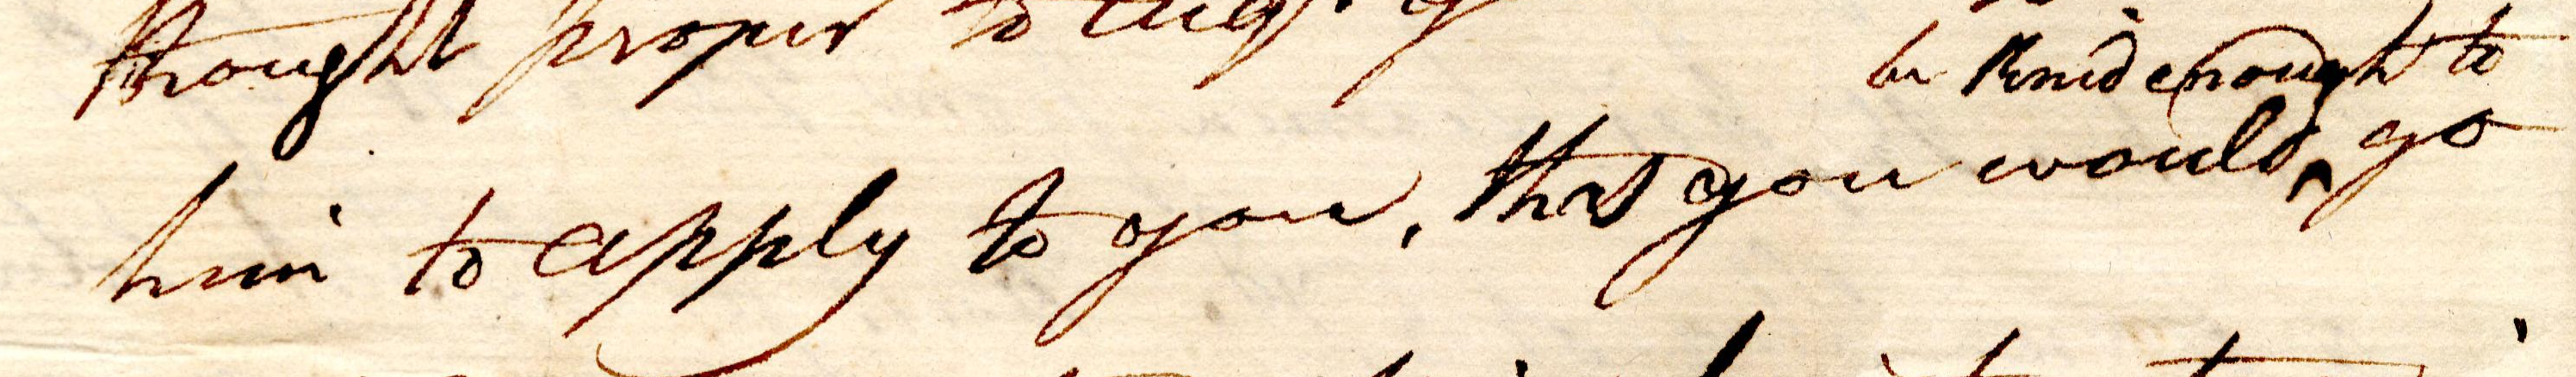him to apply to you, that you would ^ go
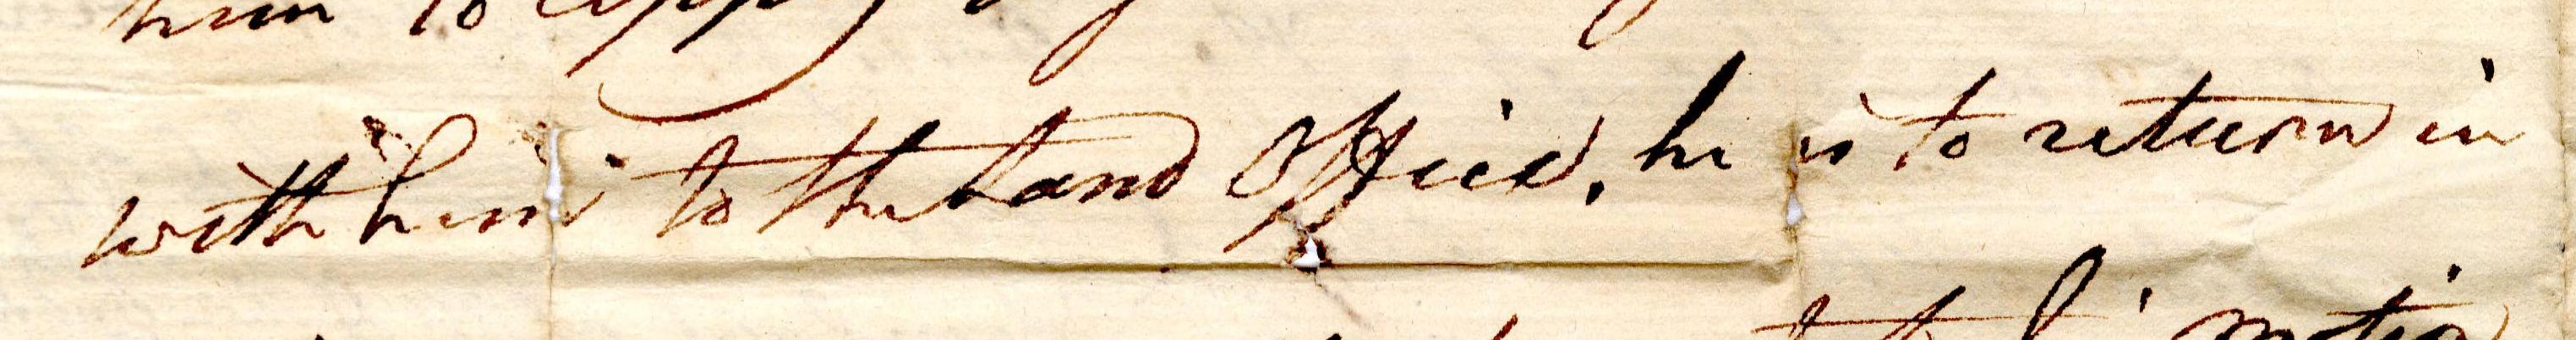with him to the Land Office, he is to return in
